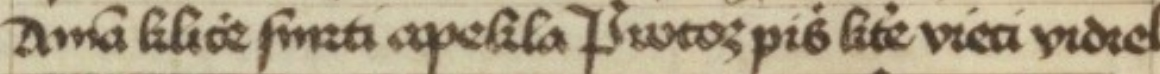A mȃ kliċe ſmrti apekla Protoz piṡ ktė vieci vidiel
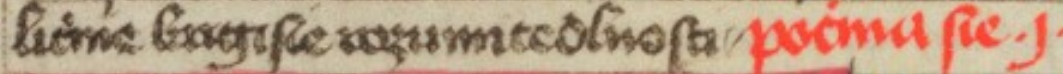liċnie kragiſie rozumitedlnoſti poċina ſie ·J
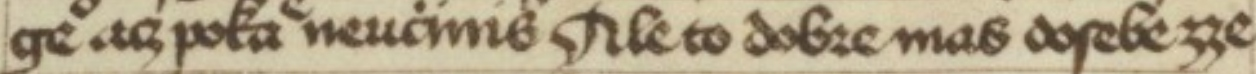ge° acz pokae neuċiniṡ Ale to dobre maṡ doſebe zze
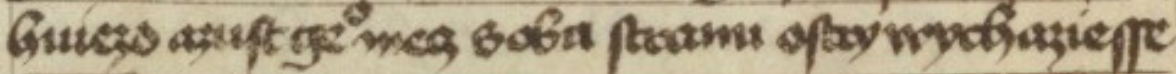huiezd azuſt ge° mecz soba ſtranu oſtry wychazieſſe
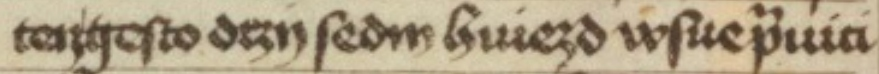ten geſto drzij ſedm huiezd wſue p̃uici
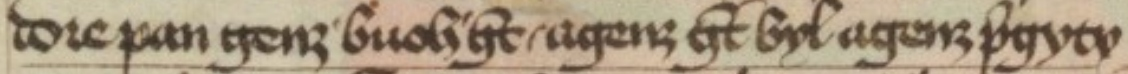doie pan genz buoh g̑t agenz g̑t byl agenz p̑gyty
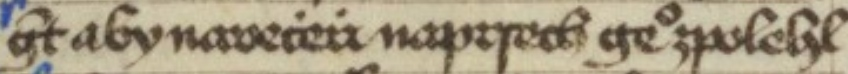g̑t aby naveċeṙi naprſech ge° zpolehl
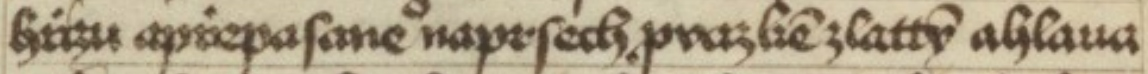kṙizu apṙepaſane° naprſech ꝓvazkȇ zlattŷ ahlaua
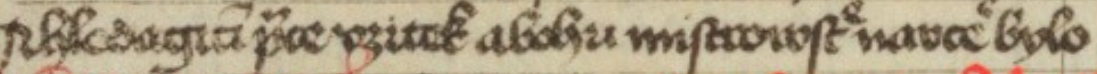Ahledagicȋ p̃ce vzitek abohu miſtrowſte navcee bylo
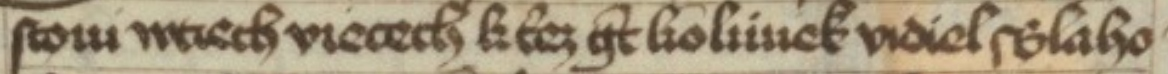ſtoui wtiech viecech k t̑ez g̑t koliuiek vidiel Blaho-
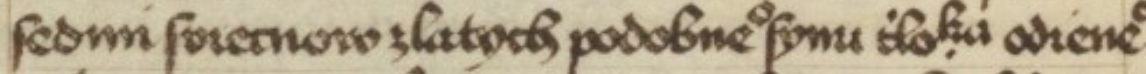ſedmi ſviecnow zlatych podobne° ſynu ċlo.ka odiene°
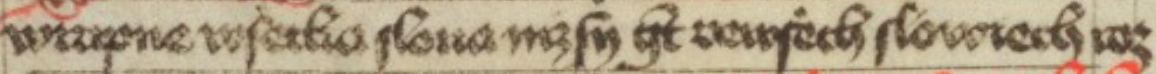wrapne wẛecko ſloua mzẛij g̑t vewẛech ſlowiech roz
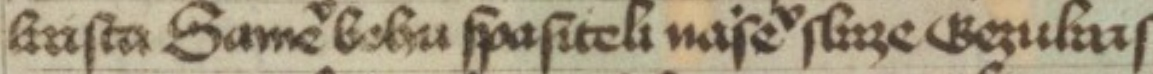kriſta Samev bohu ſpaſiteli naẛev ſkrze Gezukriſ
